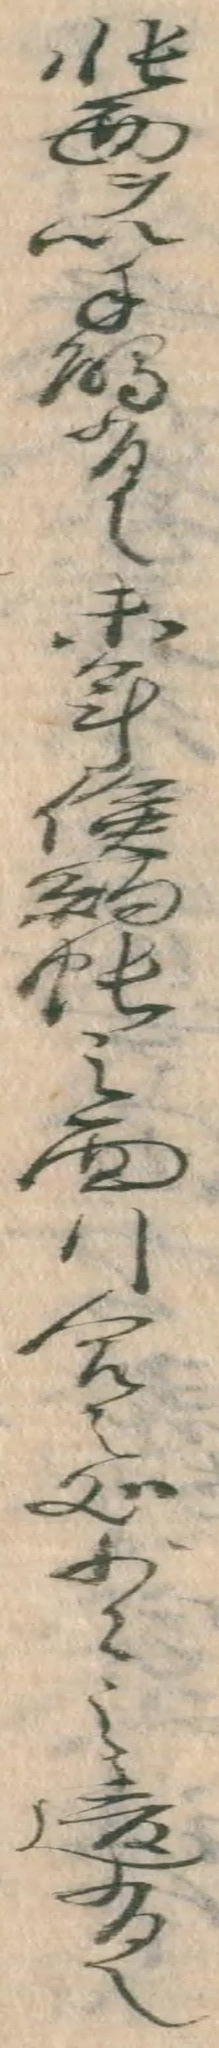帳面ヲ以手触有之未年倹約帳之面引合之処少々之違有之
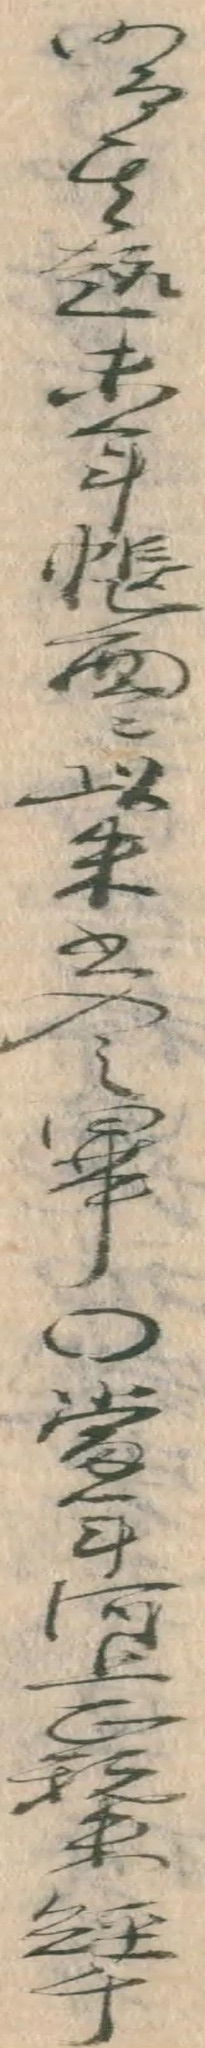仍而其趣未年帳面ニ以朱書入之畢〇當年河上正税来経千
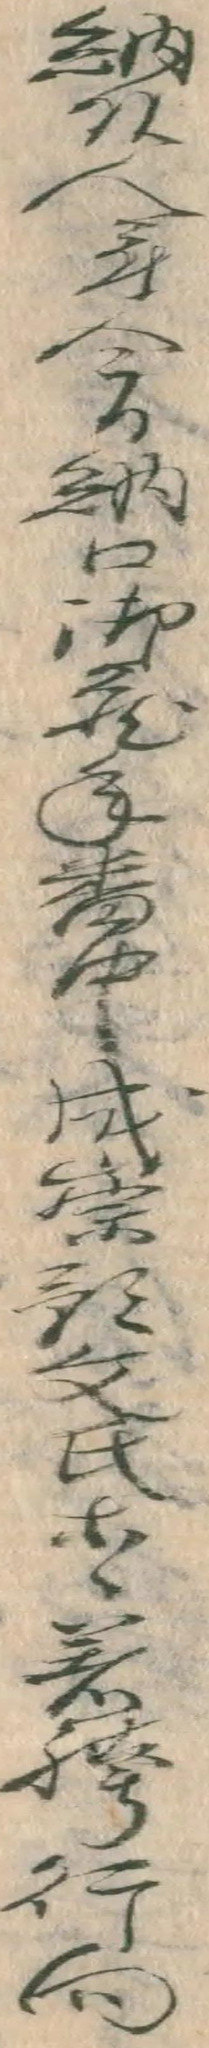納頭人ニ付今日納口御蔵年番中成崇預文氏等へ着袴行向
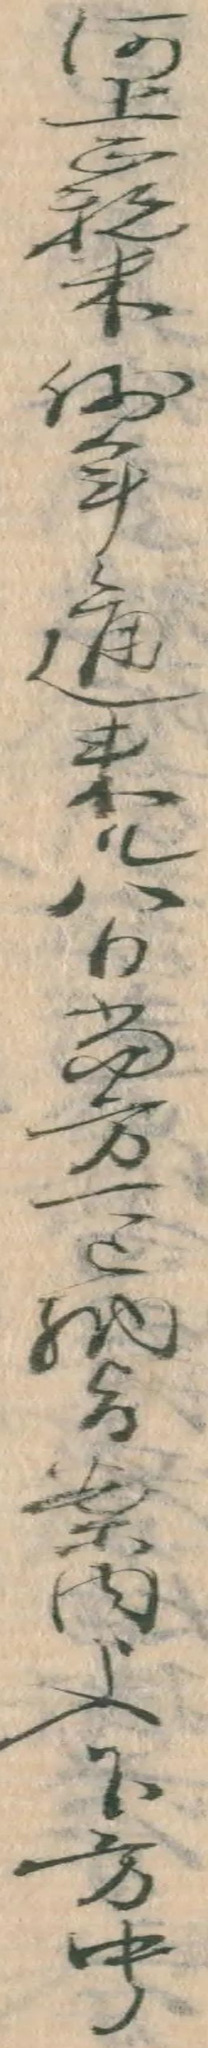河上正税米例年之通来ル八日當方可被納旨案内申入下方中ノ
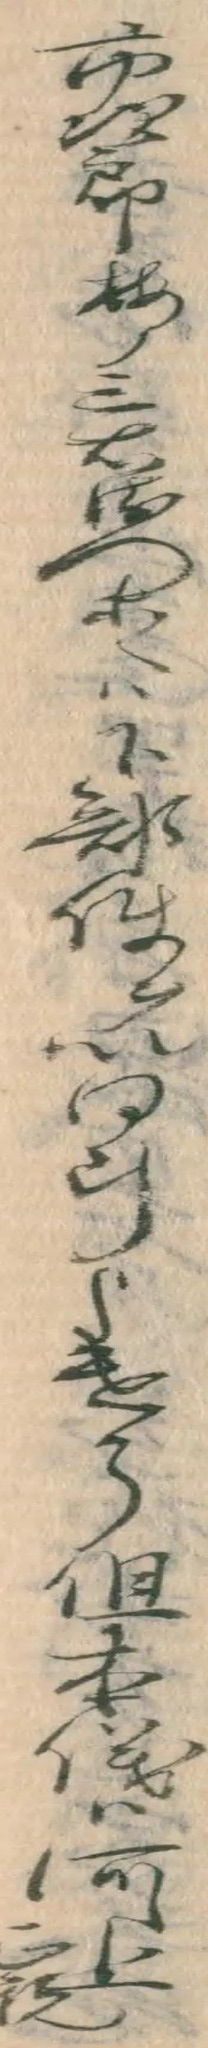市次郎梅ノ三右衛門等へハ下部使ヲ以同断申遣了但本儀ハ河上正税
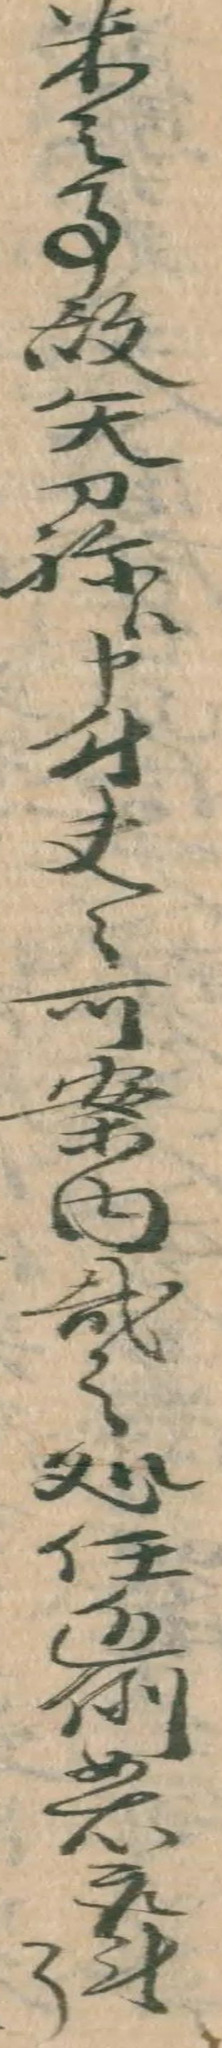米之事故矢刀祢江申付夫々可案内哉之処任近例如右宛斗了
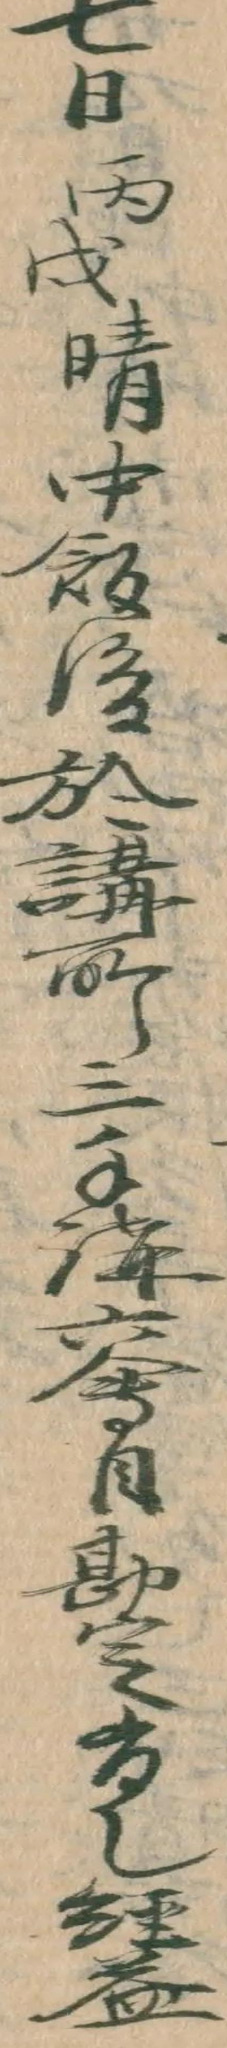七日丙戌晴中飯後於講所三手講六會自勘定有之経益
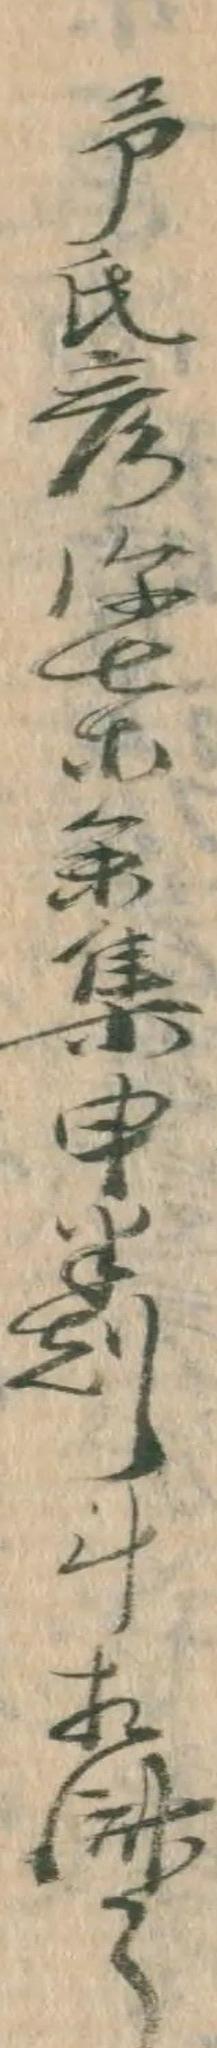予民彦弥七等参集申半刻斗相済了
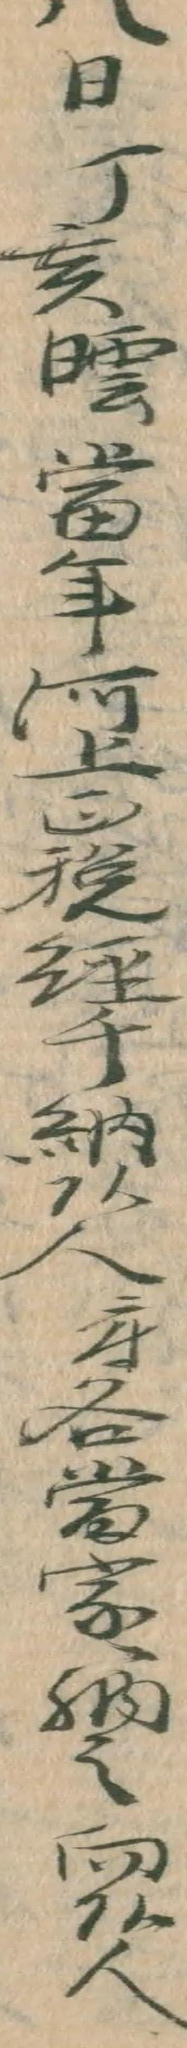八日丁亥曇當年河上正税経千納頭人ニ付各當家ヘ納也向頭人
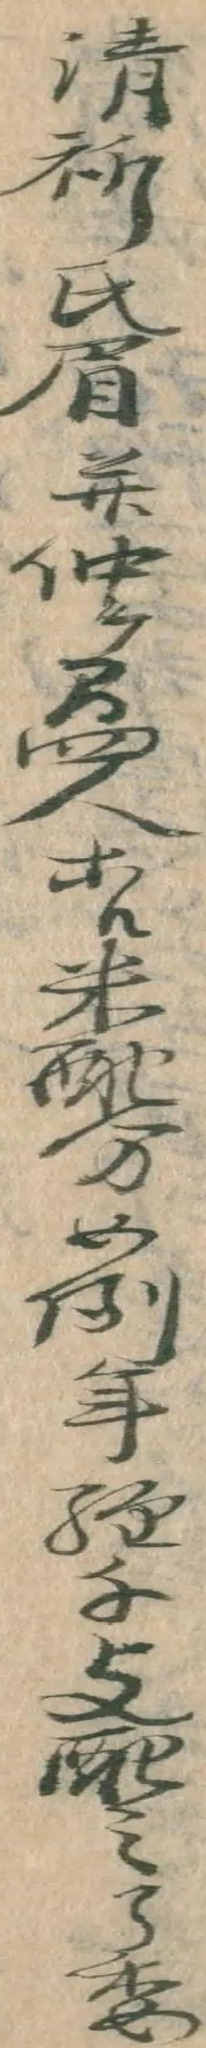清祈氏眉并仲ヶ間四人等江米配分如例年経千支配之了委
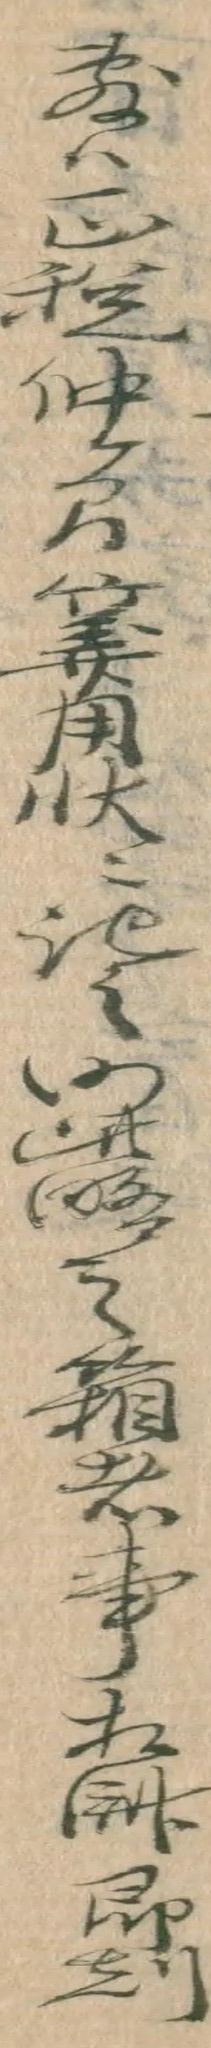敷ハ正税仲ヶ間算用状ニ記之時仍此略之箱者事相済即刻
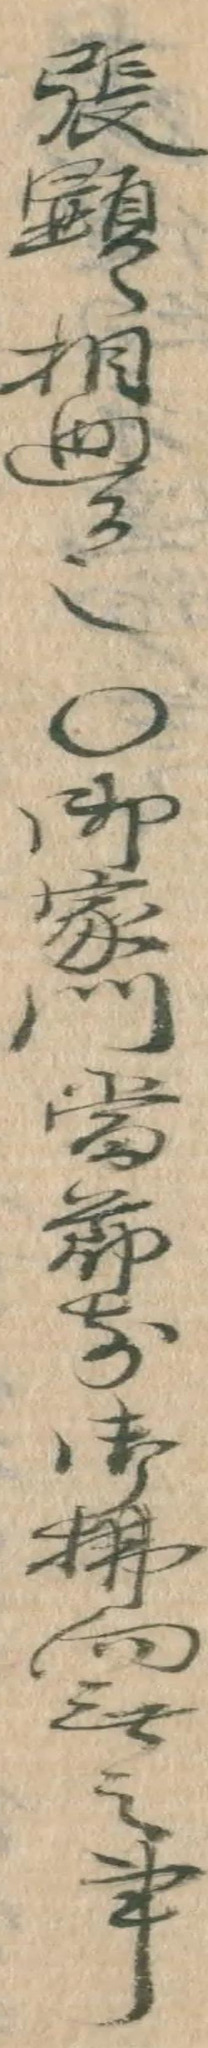張顕へ相廻候也○御家門当當節前御払向無之事
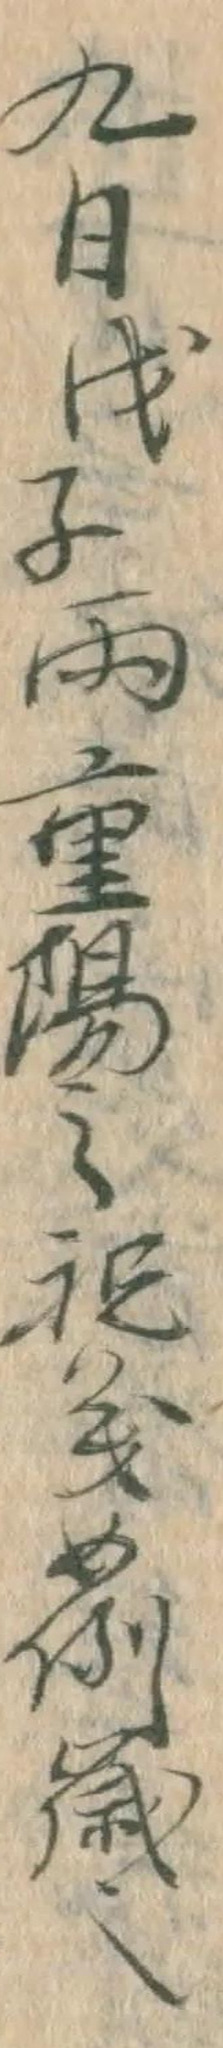九月戊子雨重陽之祝義如例歳也
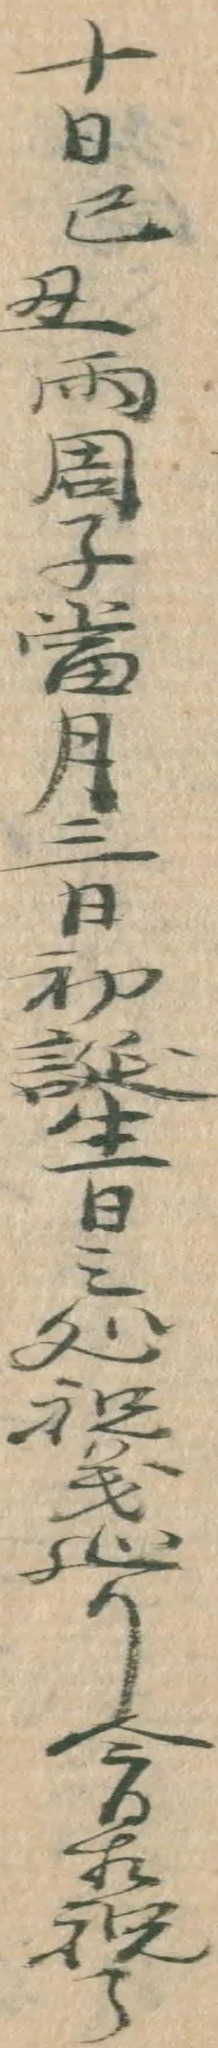十日己丑雨周子當月三日初誕生日之処祝義延り今日相祝了
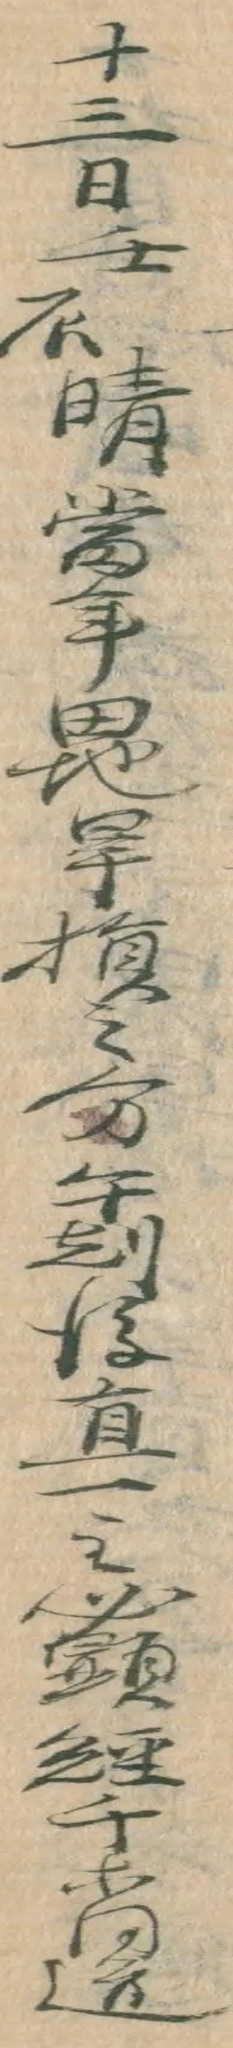十三日壬辰晴當年田地旱損之分午刻後直一主必顕経千等同道
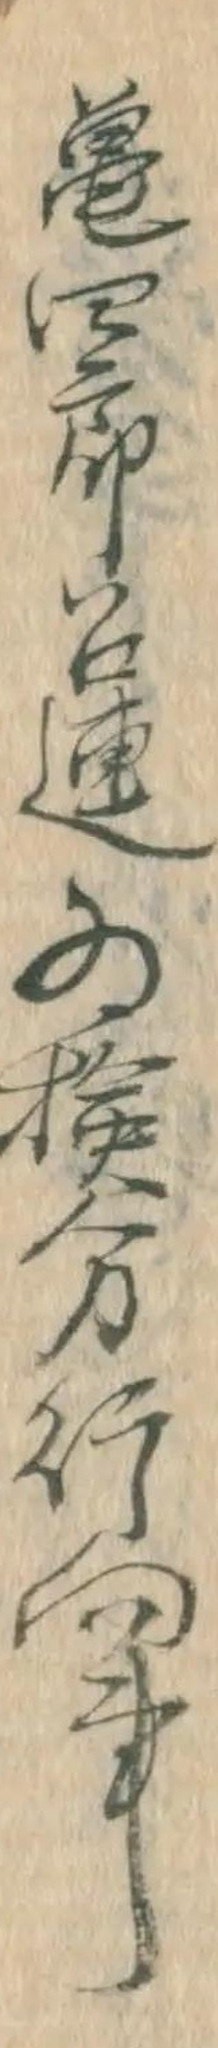亀四郎召連為検分行向事
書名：賀茂社記録. 第65冊
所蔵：国立国会図書館 National Diet Library, JAPAN
